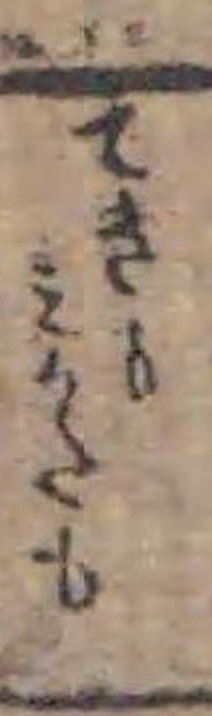てきも
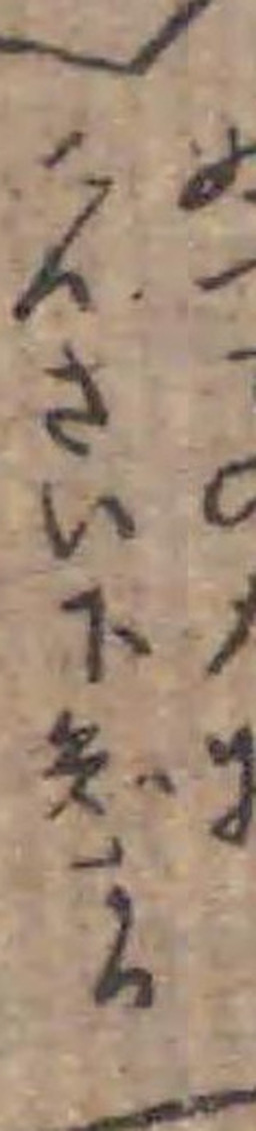くんさい下知する
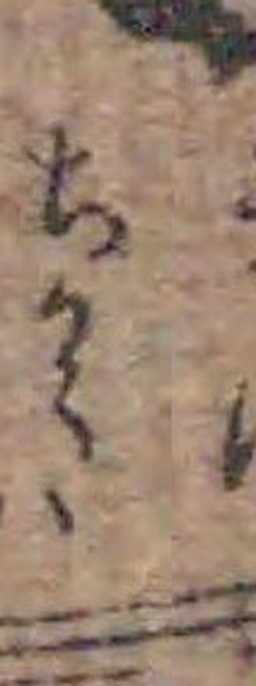ちからは
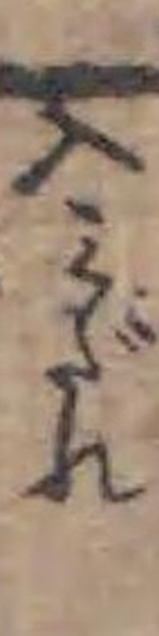入みだれ
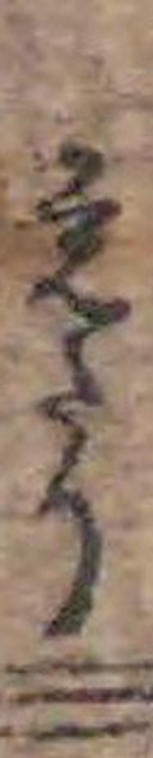覚たり
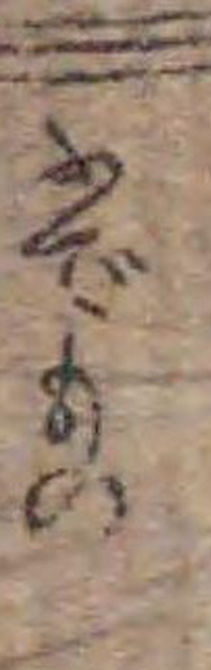ふでもの
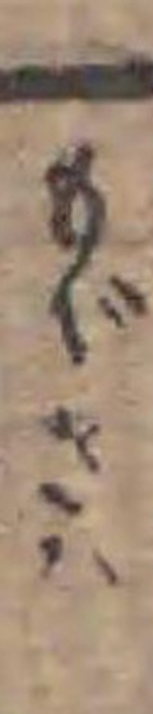もぐさは
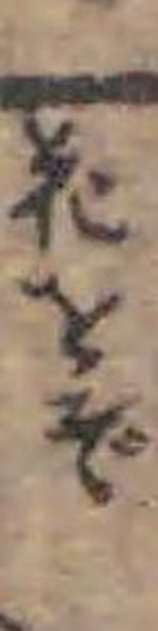花をぞ
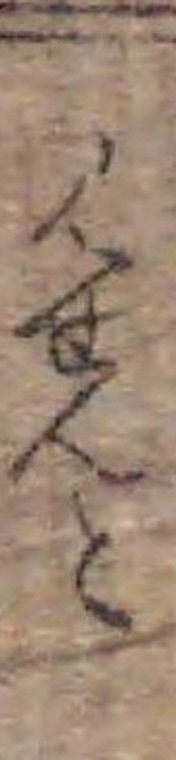見せんと
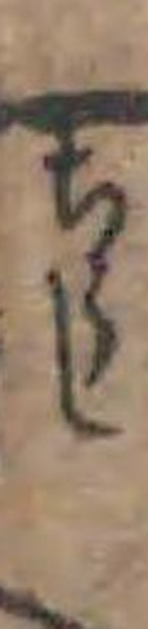ちらし
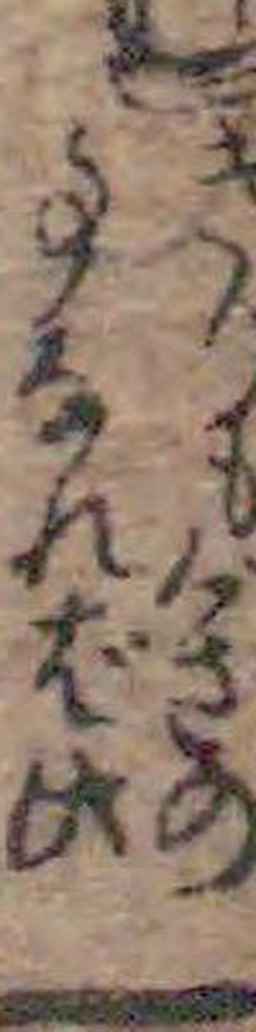事なれば此
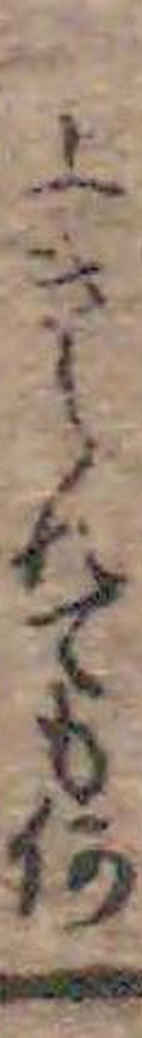上きられても何
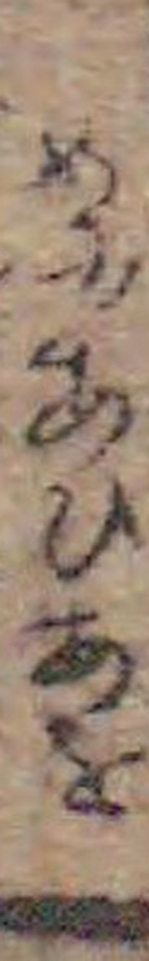めにあひあを
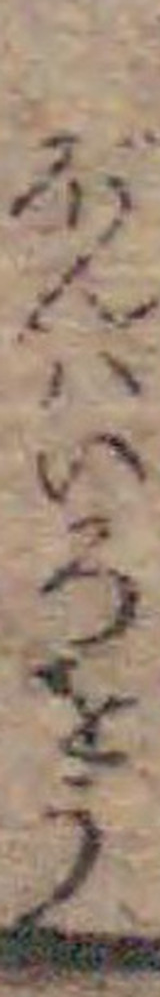ぼんはいろをう
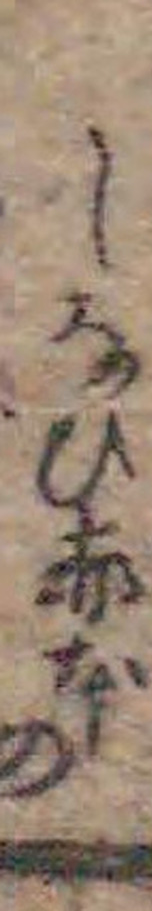しなひ赤本の
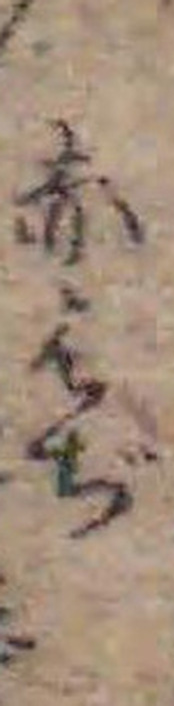赤はぢ
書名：三舛増鱗組 : 3巻
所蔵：国立国会図書館 National Diet Library, JAPAN
